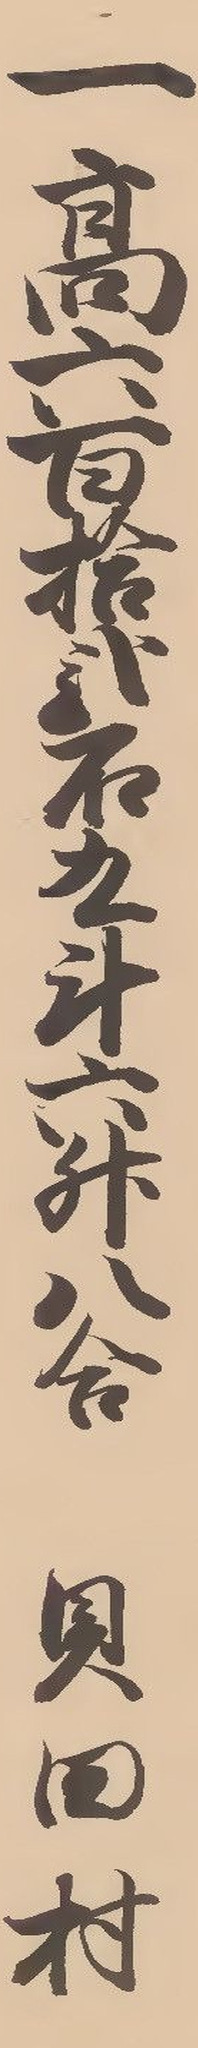一高六百拾弐石九斗六升八合貝田村
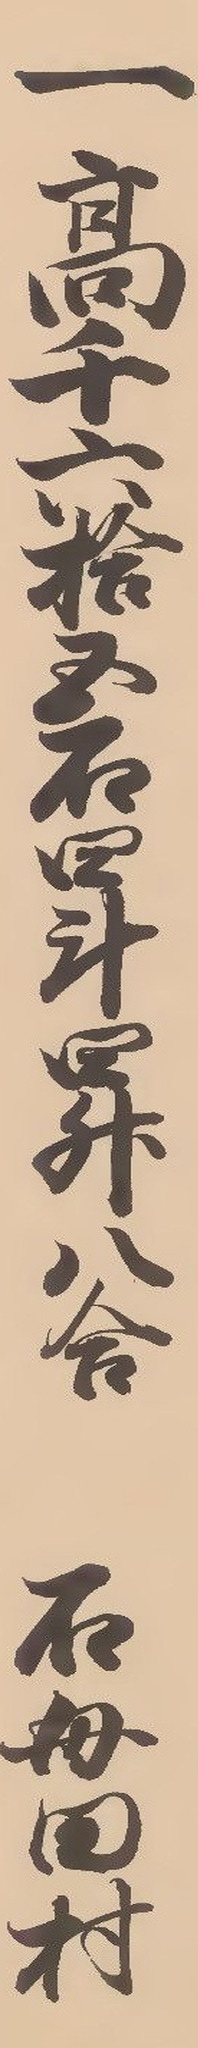一高千六拾五石四斗四升八合石母田村
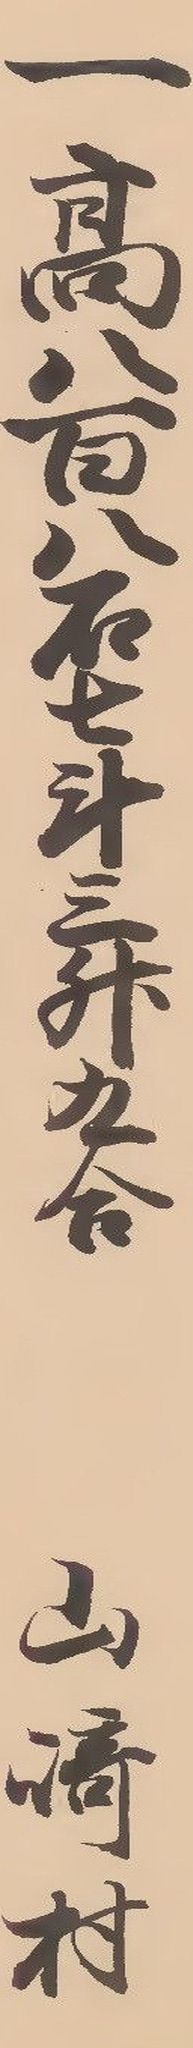一高八百八石七斗三升九合山崎村
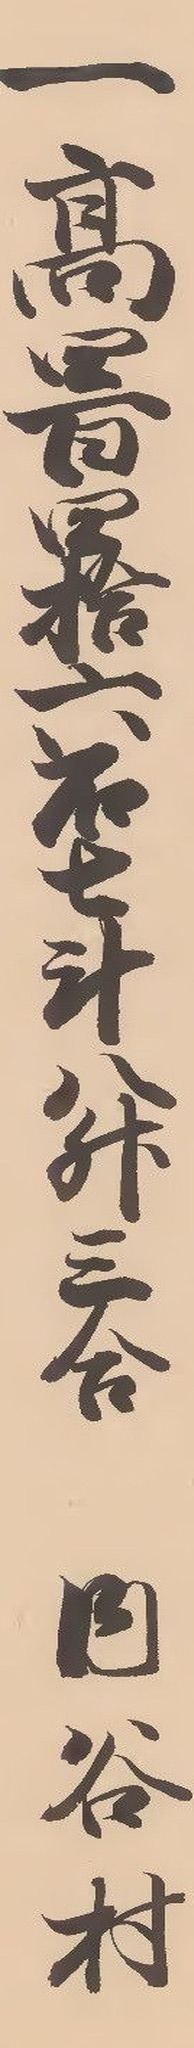一高四百四拾六石七斗八升三合内谷村
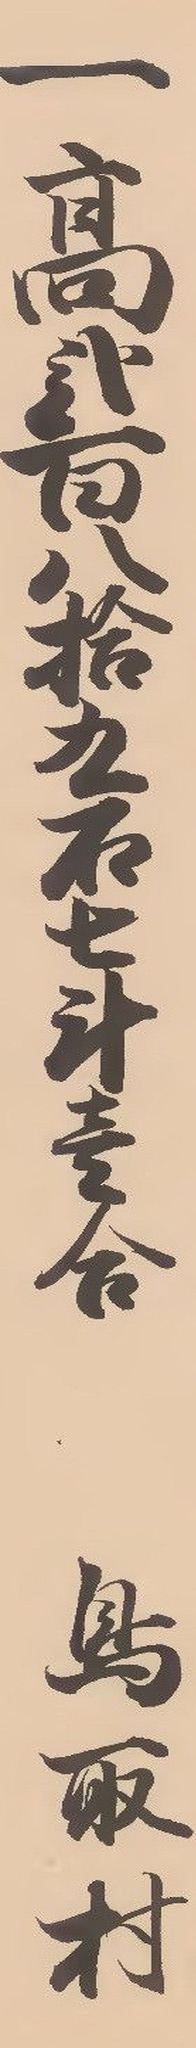一高弐百八拾九石七斗壱合鳥取村
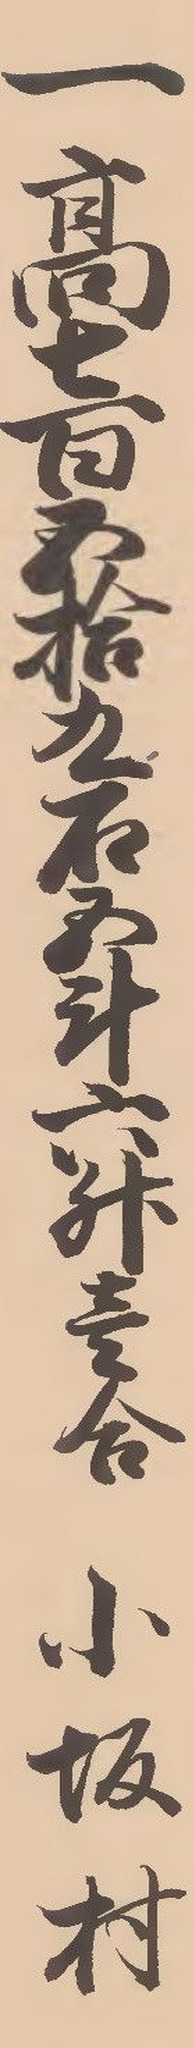一高七百五拾九石五斗六升壱合小坂村
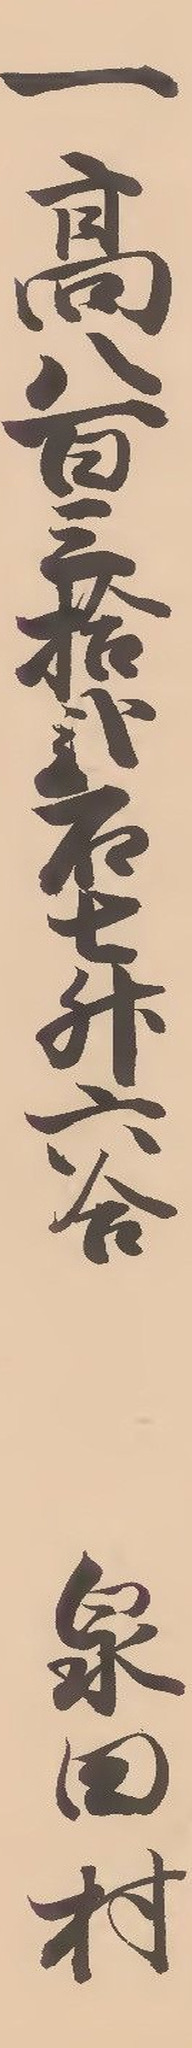一高八百三拾弐石七升六合泉田村

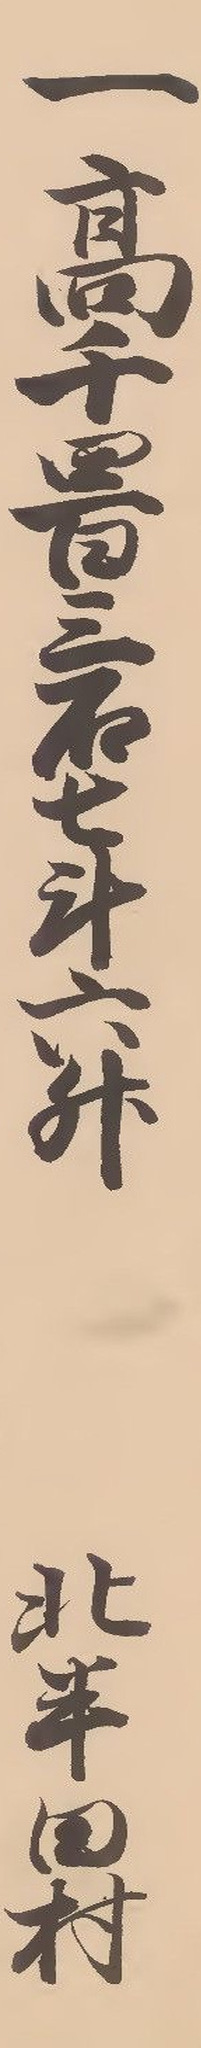一高千四百三石七斗六升北半田村
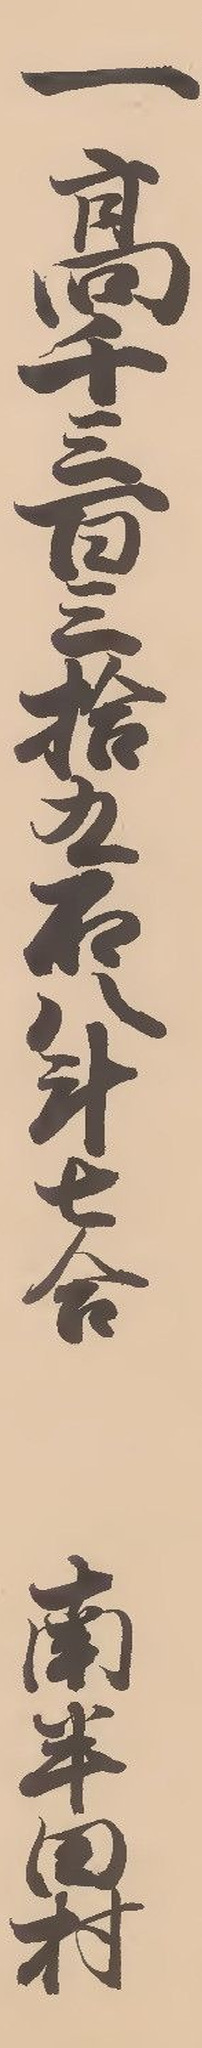一高千三百三拾九石八斗七合南半田村
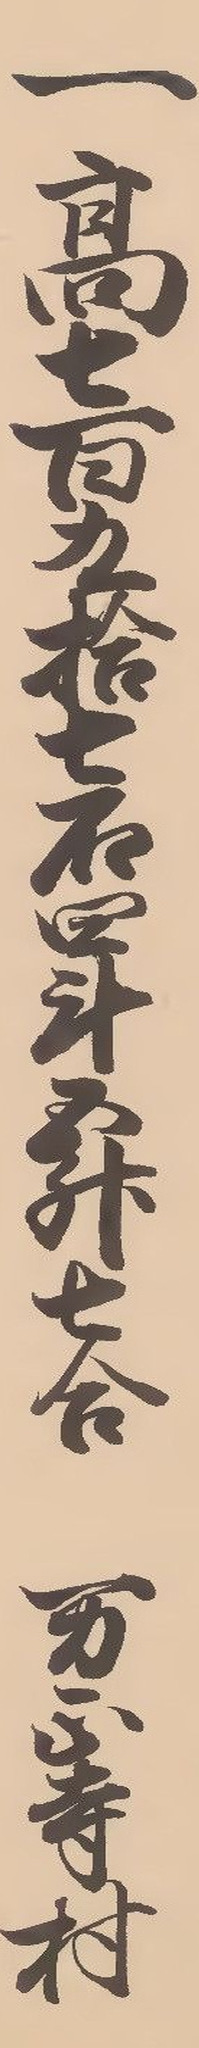一高七百九拾七石四斗五升七合万正寺村
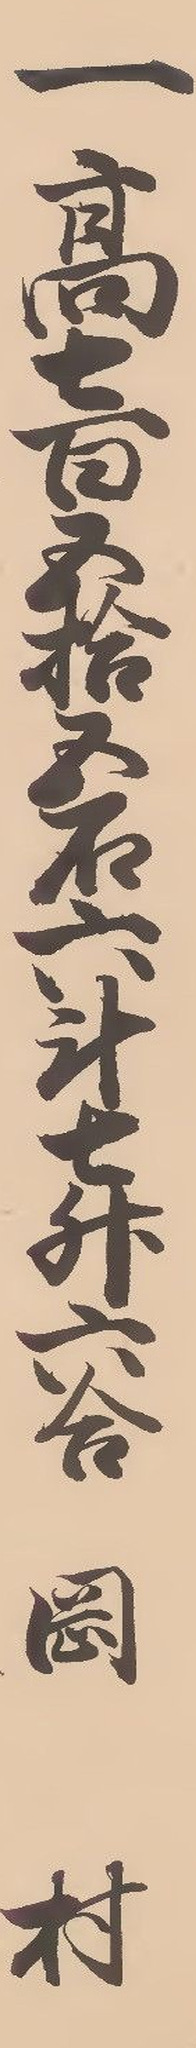一高七百五拾五石六斗七升六合岡村
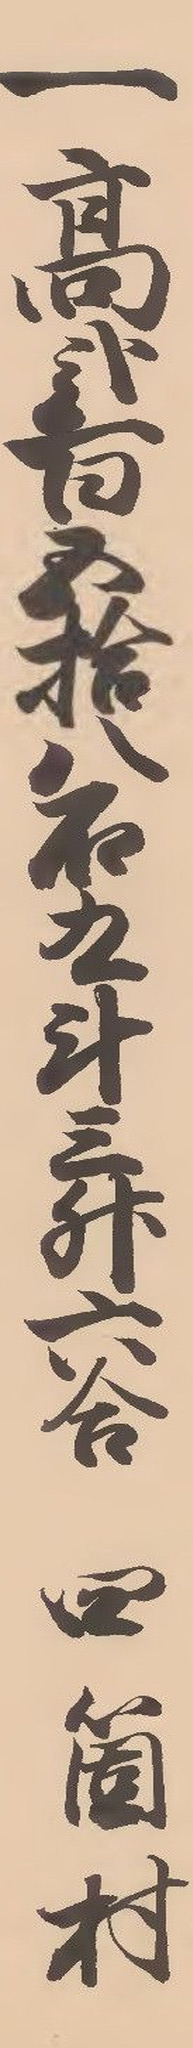一高弐百五拾八石九斗三升六合四箇村
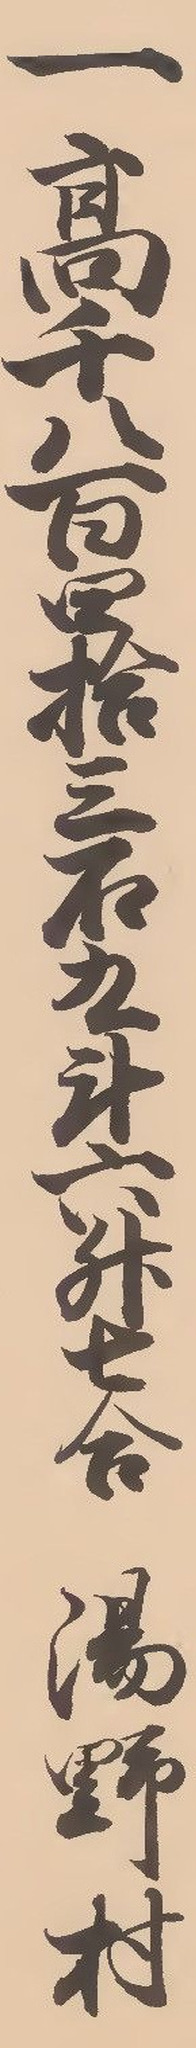一高千八百四拾三石九斗六升七合湯野村
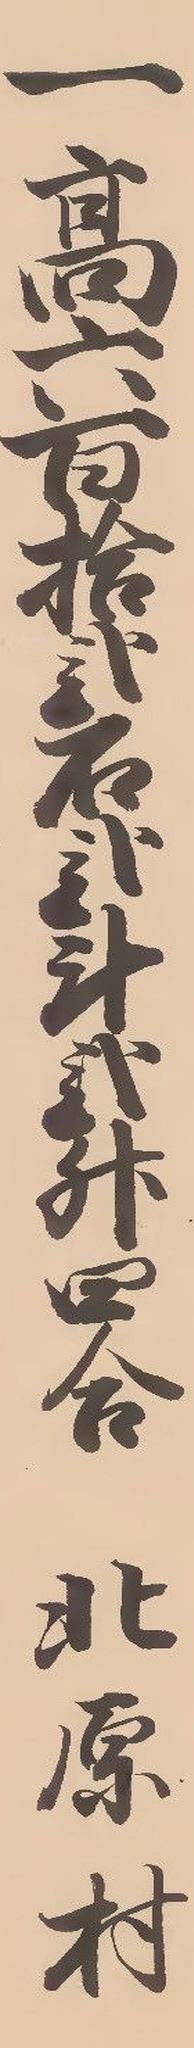一高六百拾弐石弐斗弐升四合北原村
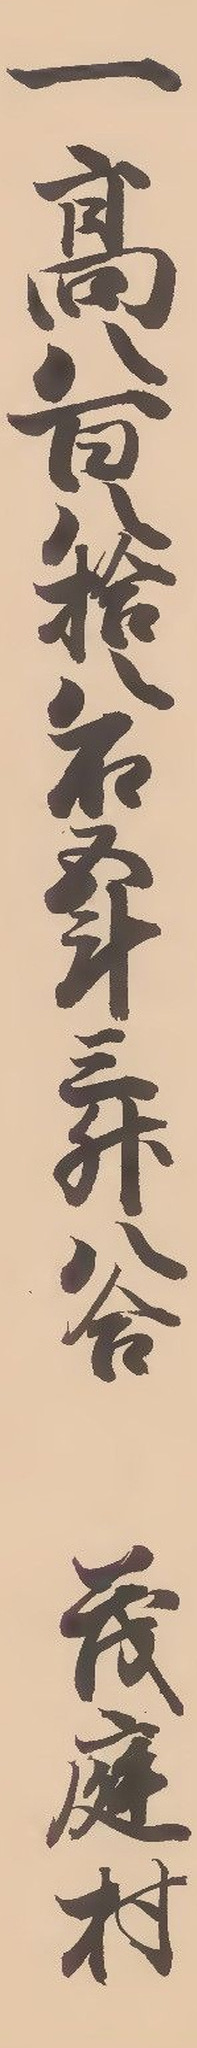一高八百八拾八石五斗三升八合茂庭村

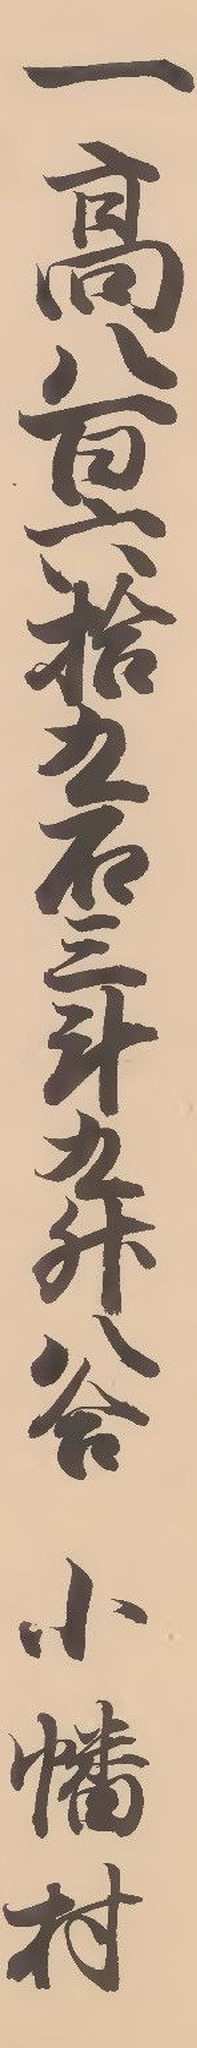一高八百六拾九石三斗九升八合小幡村
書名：陸奥国郷帳　４
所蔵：国立公文書館 National Archives of Japan
